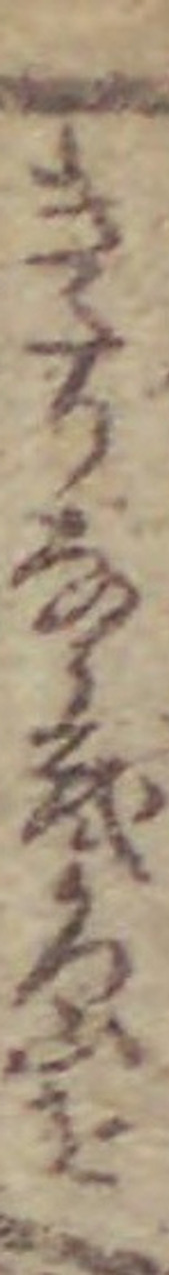きたりなら茂かつ山を
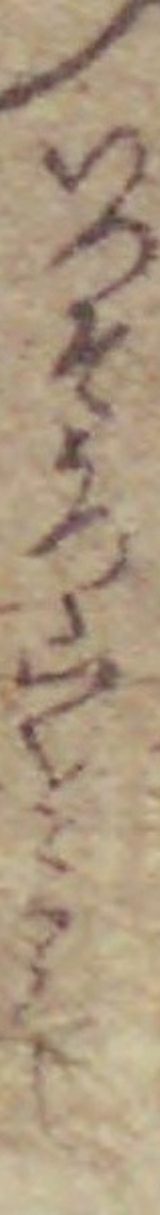いつそかつ山を……
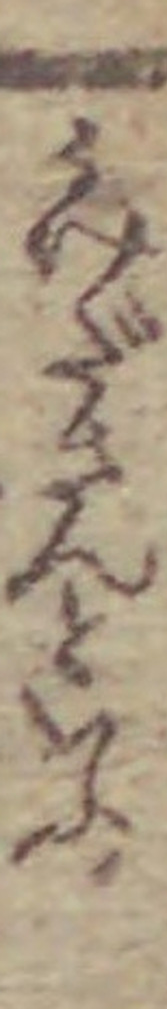うけださんといふ
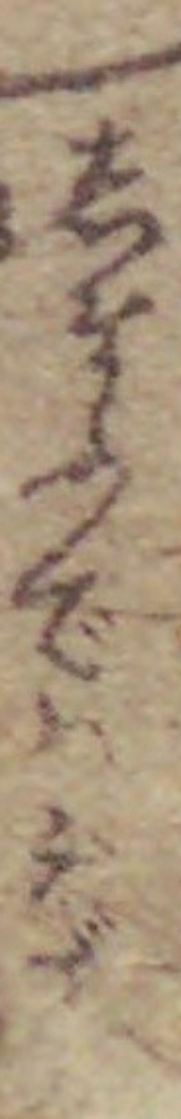しまふでは……
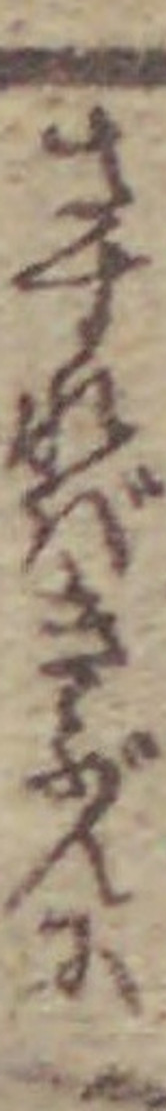さすればきぶんに
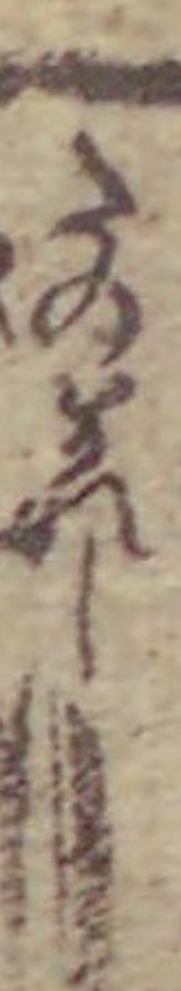たのまれし
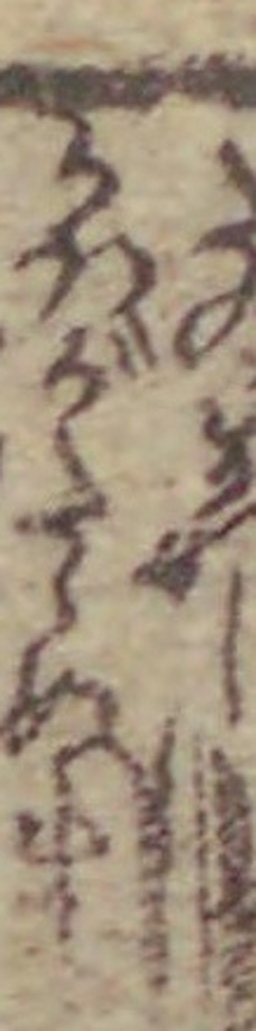かほがたゝぬま
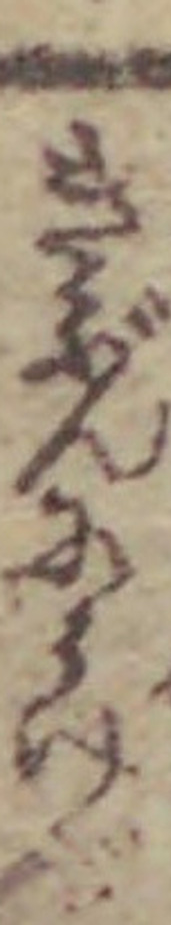きぶんにうけだ
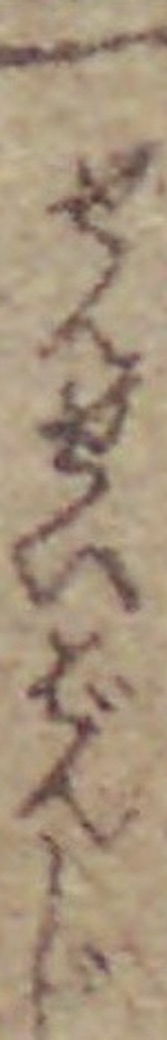せんせいばんじ
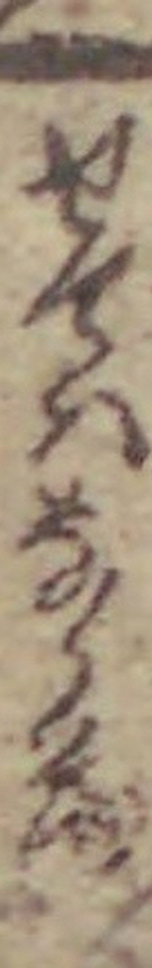せてはなら茂
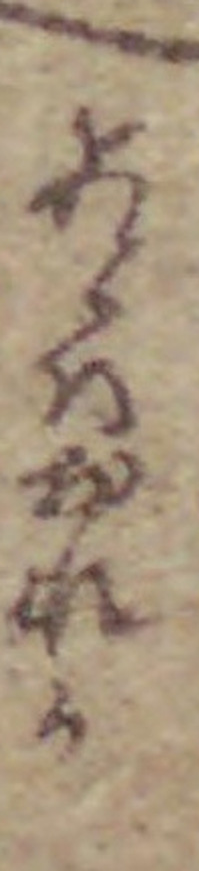あとはおれか
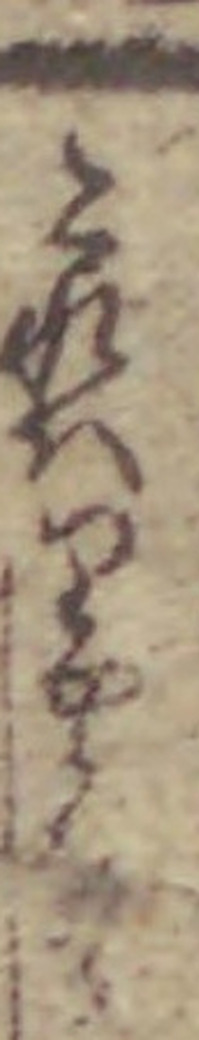これはりやうの
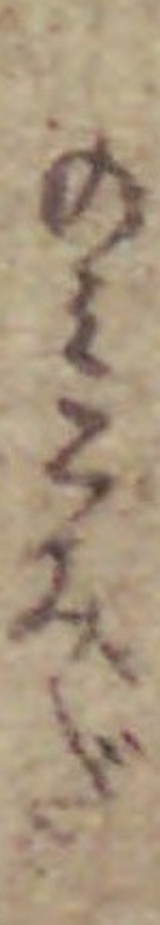のみこみだ
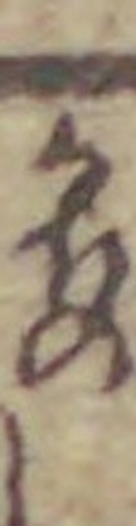かほの
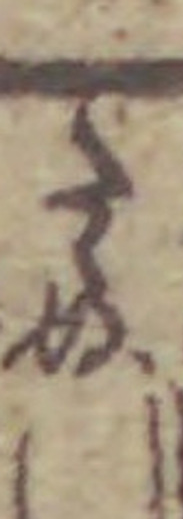たゝぬ
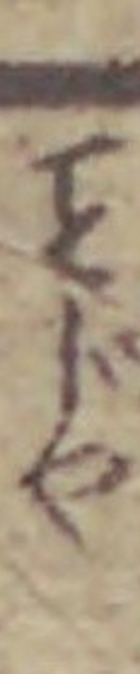ことじや
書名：大通其面影 2巻
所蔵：国立国会図書館 National Diet Library, JAPAN
